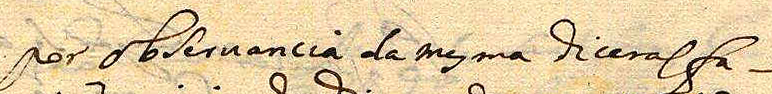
por obseruancia da mesma diceraꝭ fa
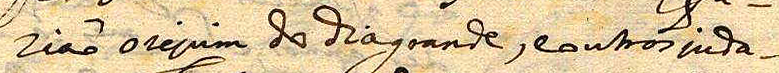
ziaõ o iejum do dia grande, e outros iuda
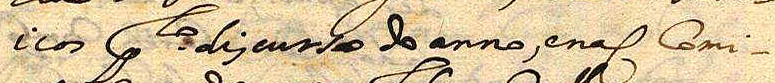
icos p.lo discurso do anno, e naꝭ Comi
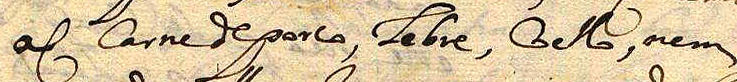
aꝭ carne de porco, Lebre, Coelho, nem
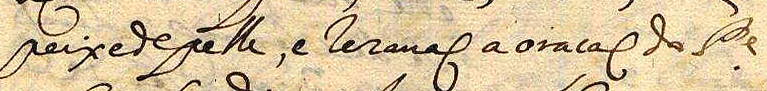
peixe de pelle, e Rezauaꝭ a oraçaꝭ do Pe.
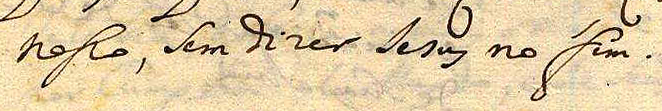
nosso, sem dizer Iesus no fim.
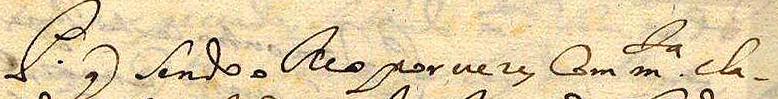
P. q̄ Sendo o Reo por uezes Com m.ta cha
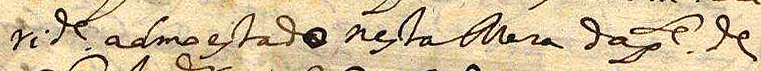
ride. admoestado nesta Meza da pte. de
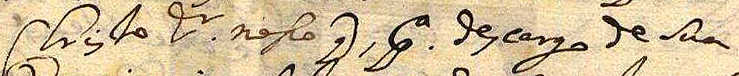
Christo sor. nosso q̄, p.a descargo de sua
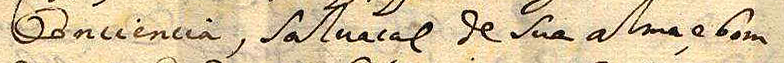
Conciencia, saluaçaꝭ de sua alma, e bom
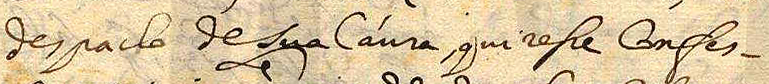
despacho de sua Cauza, quizesse Confes
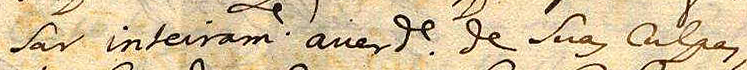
sar inteiram.te a uerd.e de suas Culpas,
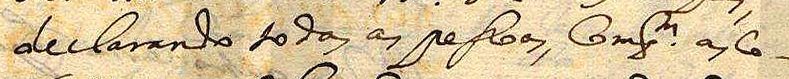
declarando todas as pessoas, Com q.m as co
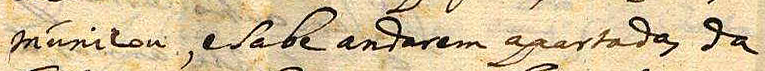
mūnicou, e sabe andarem apartadas da
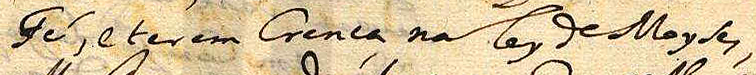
Fé, e terem Crença na ley de Moyses
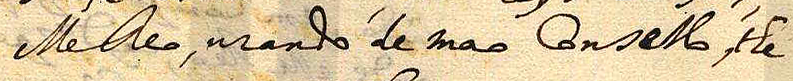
elle Reo, uzando de mao Conselho, the
